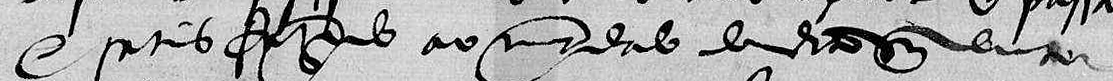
e satisfaz̄edo ao mādado do dito s̄r doutor
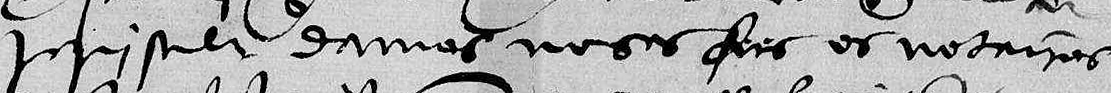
Jnqujsidor damos nosas fees os notairos
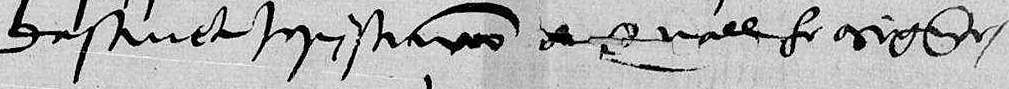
da sancta Jnqujsição a quall he a seguj̄te/
